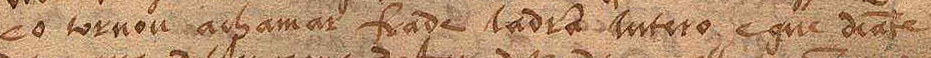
e o tornou a chamar frade ladrā lutero e que diāte
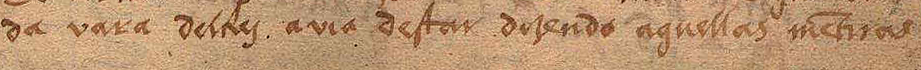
da vara del Rej avia destar dizendo aquellas mētiras
